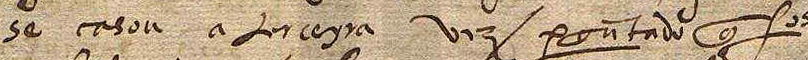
se casou a terceyra vez / ꝑgūtado q̄ fos
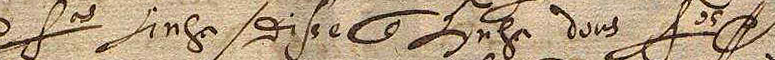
e fas tinha / disse q̄ tynha dous fos e
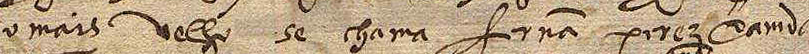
o mais velho se chama fernã perez e amda
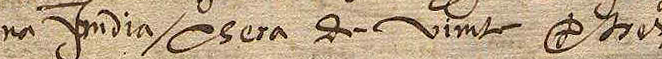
na Jmdia / e sera de vimte e tres
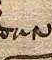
pouco
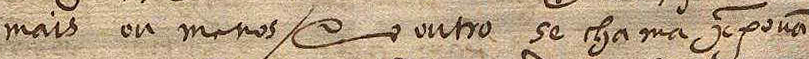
mais ou menos / e o outro se chama x̄pouā
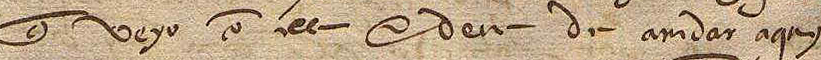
q̄ veyo c̄o elle e deue de amdar aquy
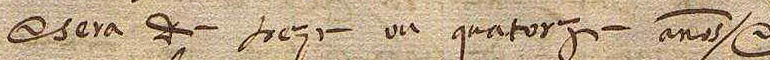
e sera de treze ou quatorze ānos / e
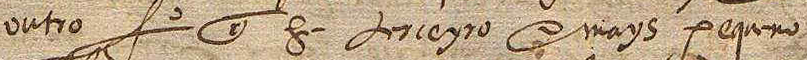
outro fo q̄ he terceyro e mays pequeno
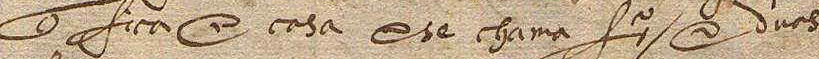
q̄ fica ē casa e se chama frco / e duas
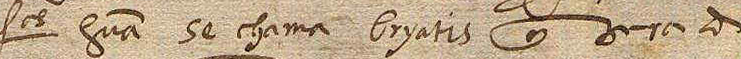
fas hūa se chama bryatis q̄ sera de
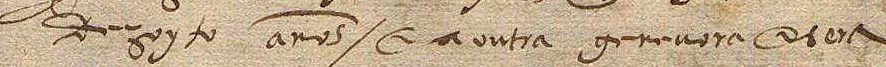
dezoyto ānos / e a outra geneuora e sera
